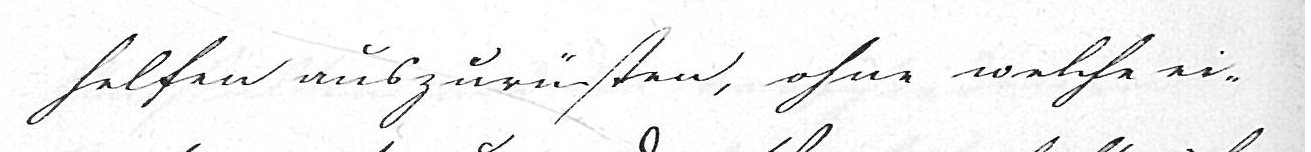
helfen auszurüsten, ohne welche ei-
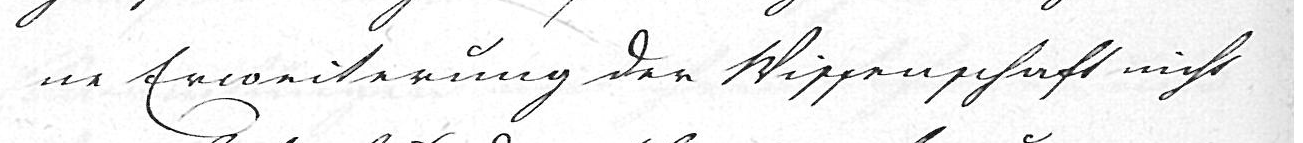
ne Erweiterung der Wissenschaft nicht
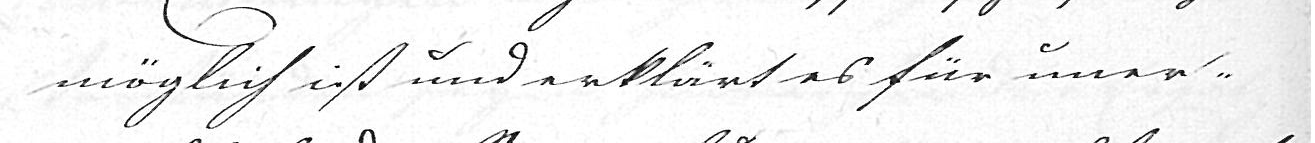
möglich ist und erklärt es für uner-
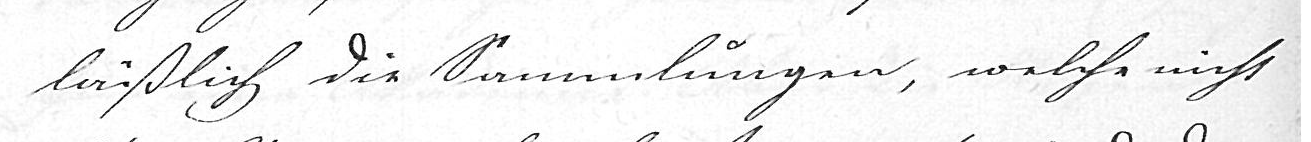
läßlich die Sammlungen, welche nicht
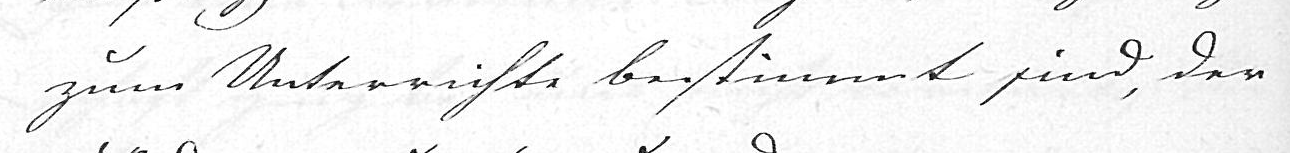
zum Unterrichte bestimmt sind, der
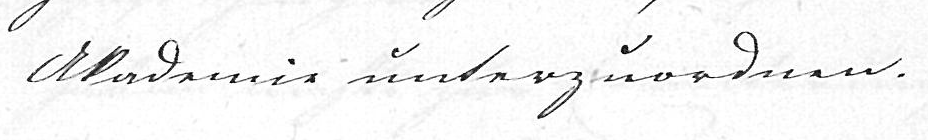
Akademie unterzuordnen.
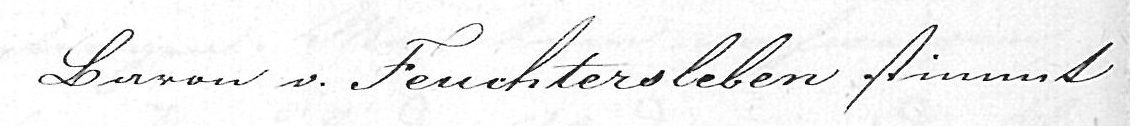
Baron v. Feuchtersleben stimmt
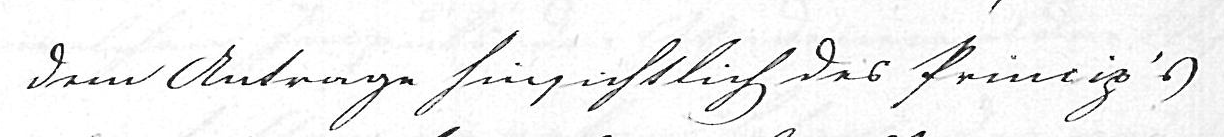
dem Antrage hinsichtlich des Princip's
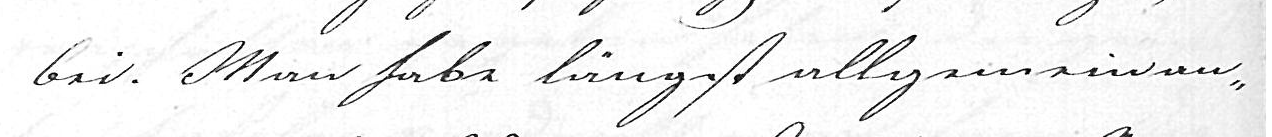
bei. Man habe längst allgemein an-
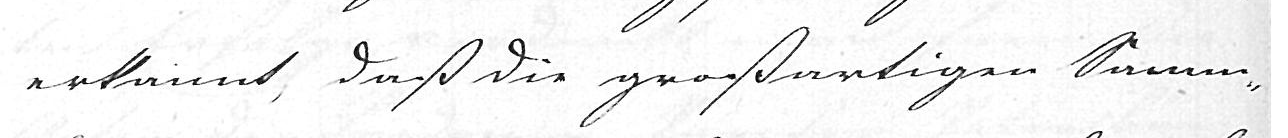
erkannt, daß die großartigen Samm-
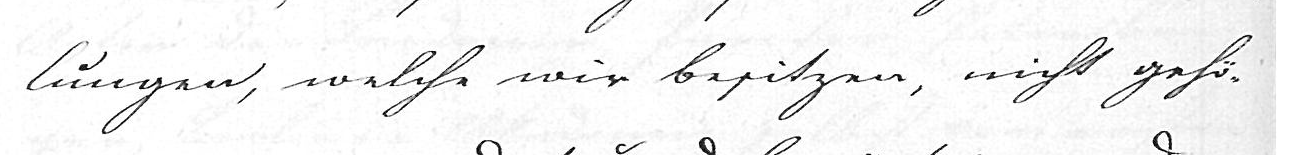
lungen, welche wir besitzen, nicht gehö-
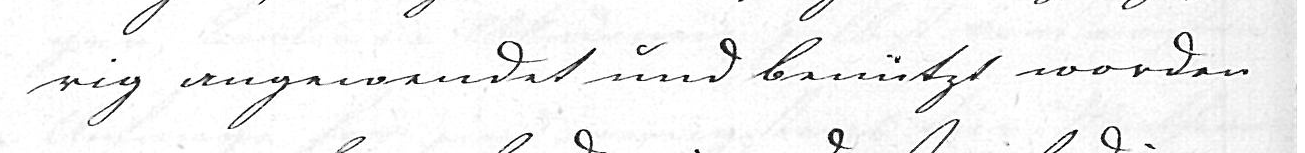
ein angewendet und benützt worden
